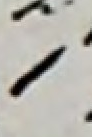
1
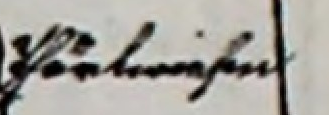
Thörlwiesen
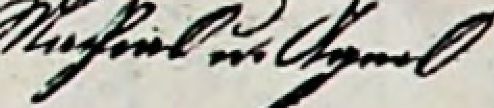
Mathias u. Agnes
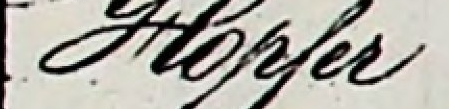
Hopfer
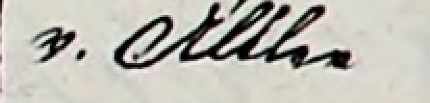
v. Altler
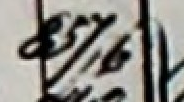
857,6
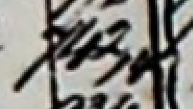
742,4
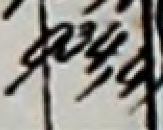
934,4
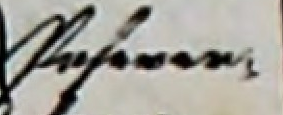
P???
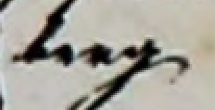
berg
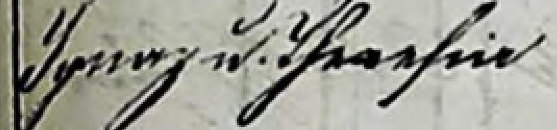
Ignaz u. Theresia
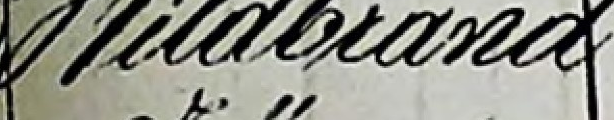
Hildbrand
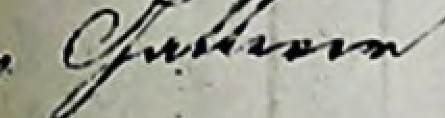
v. Gatterer
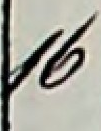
16
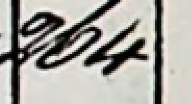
264
